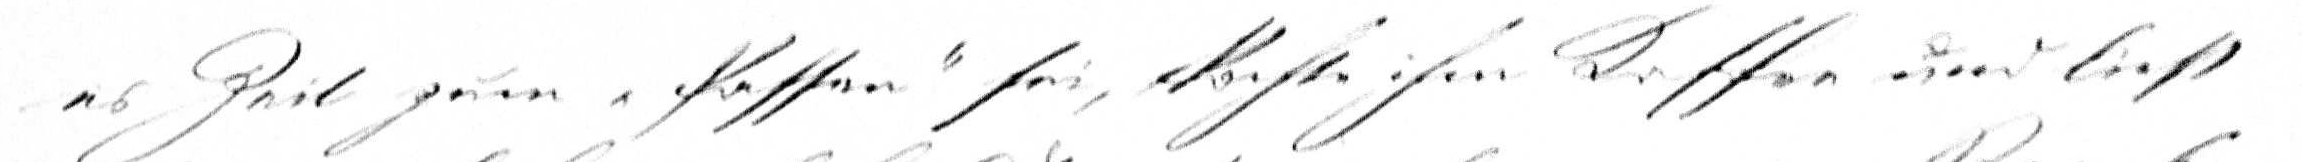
es Zeit zum „Passen“ sei, kochte ihm Kaffee und ließ
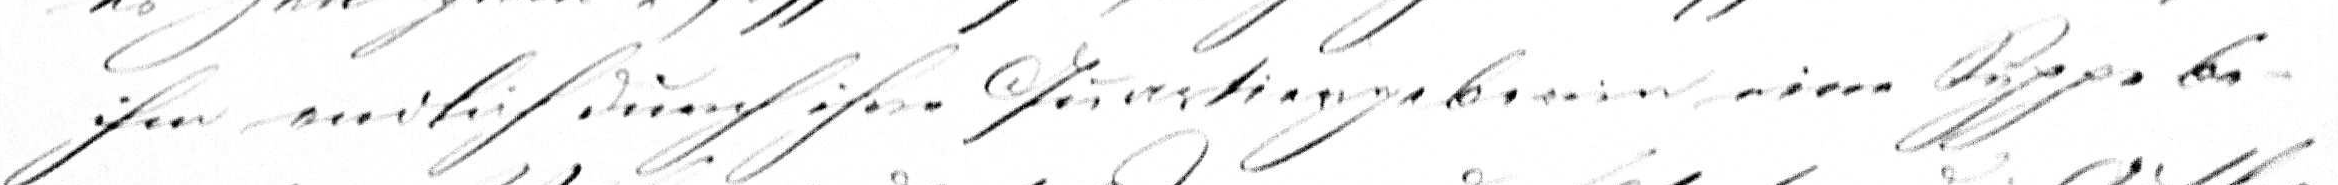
ihm endlich durch ihre Quartiergeberin eine Suppe be¬
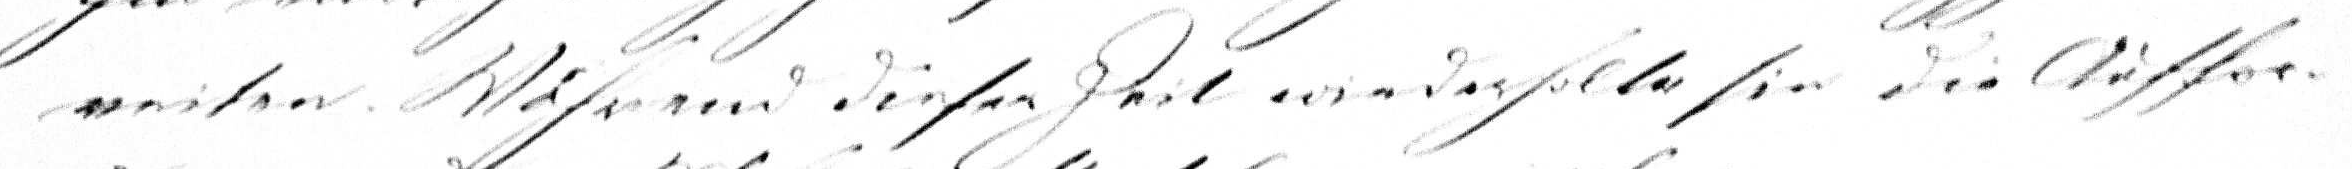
reiten. Während dieser Zeit wiederholte sie die Auffor¬
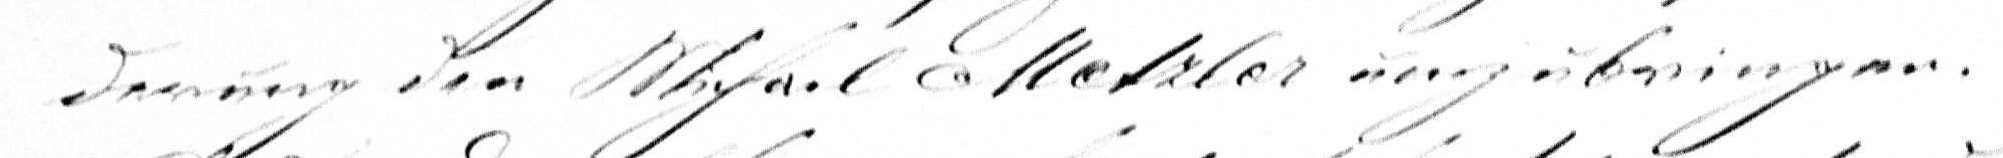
derung den Michael Metzler umzubringen.
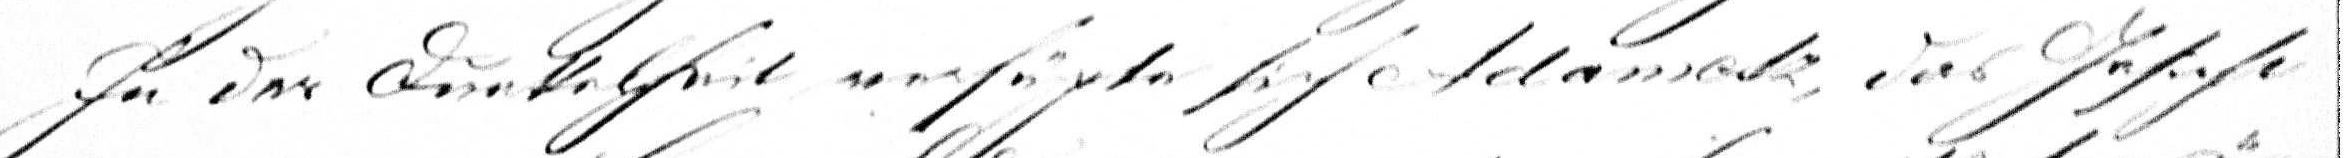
In der Dunkelheit verfügte sich Adametz, das Gesicht
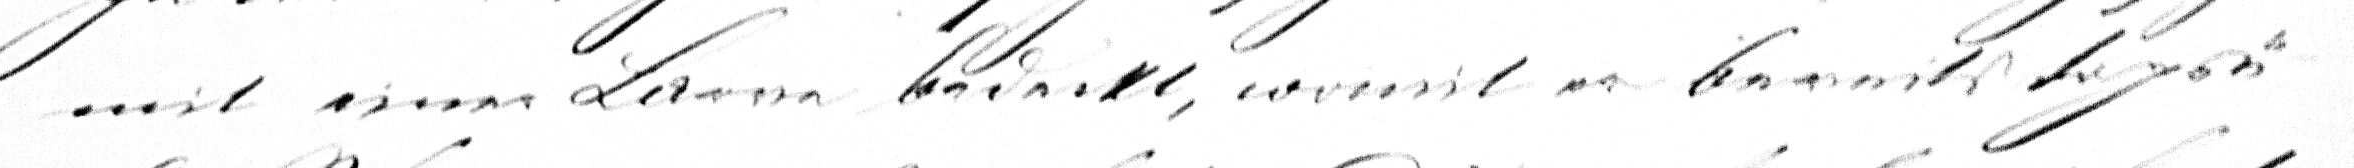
mi einer Larve bedeckt, womit er bereits tagsü¬
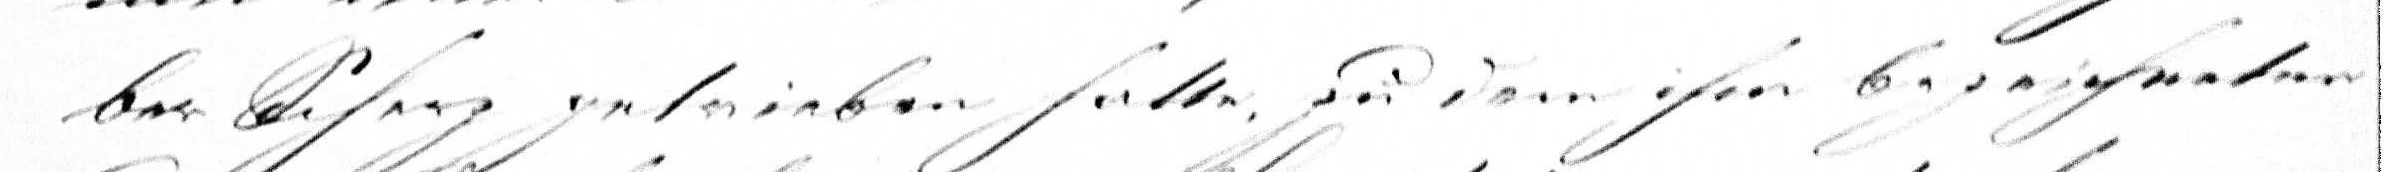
ber scherz getrieben hatte, zu dem ihm bezeichneten
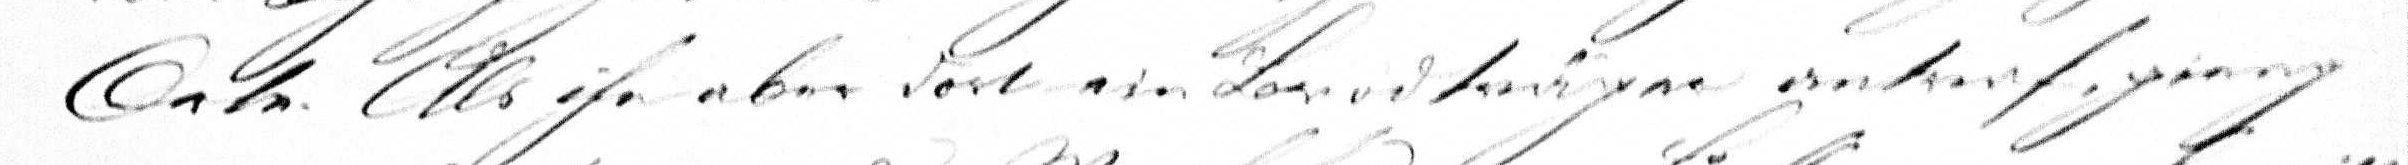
Orte. Als ihn aber dort ein Brodträger antraf, gieng
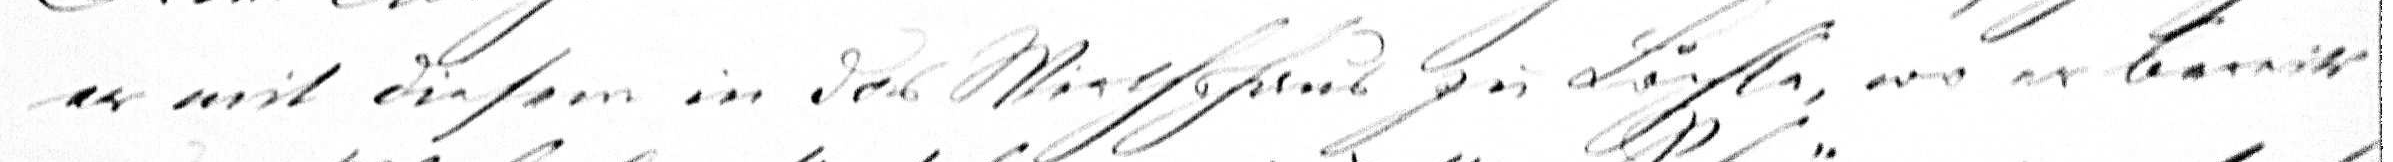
er mit diesem in das Wirthshaus zu Löchte, wo er bereit
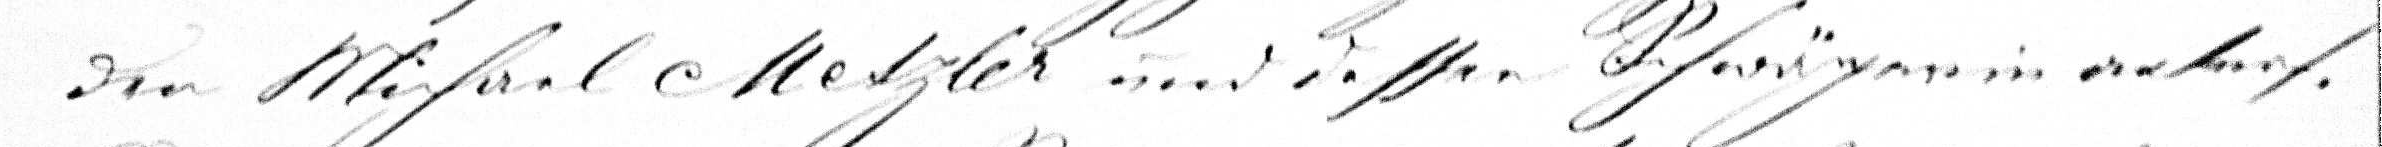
den Michael Metzler und dessen Schwägerin antraf.
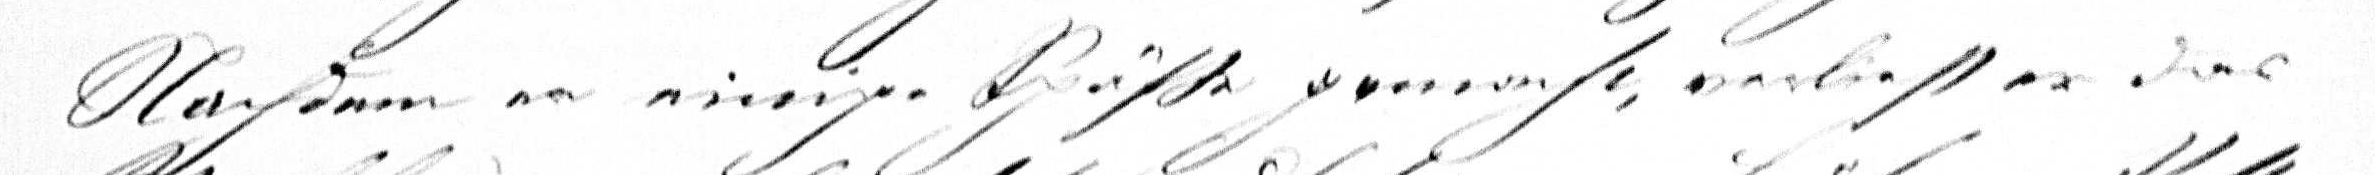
Nachdem er einige Spässe gemacht, verließ er das
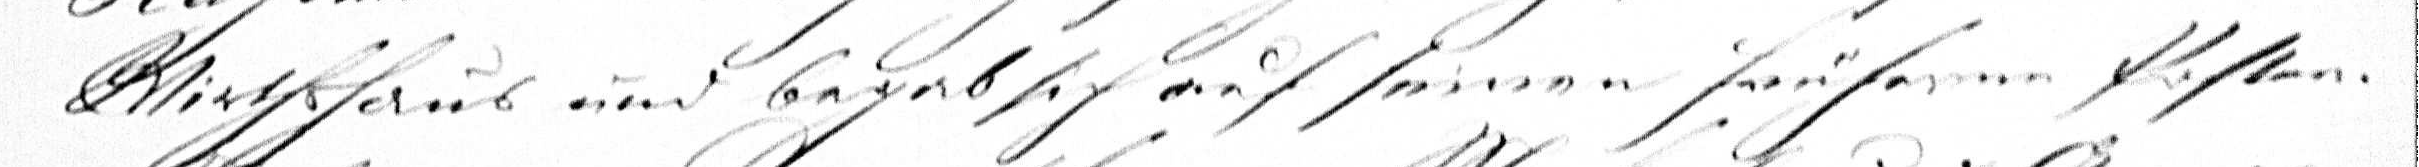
Wirthshaus und begab sich auf seinen früheren Posten.
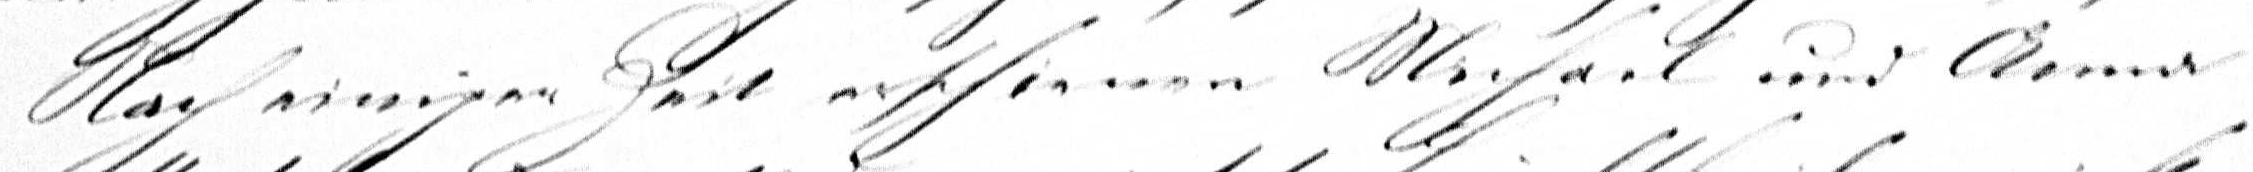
Nach einiger Zeit erschienen Michael und Anna
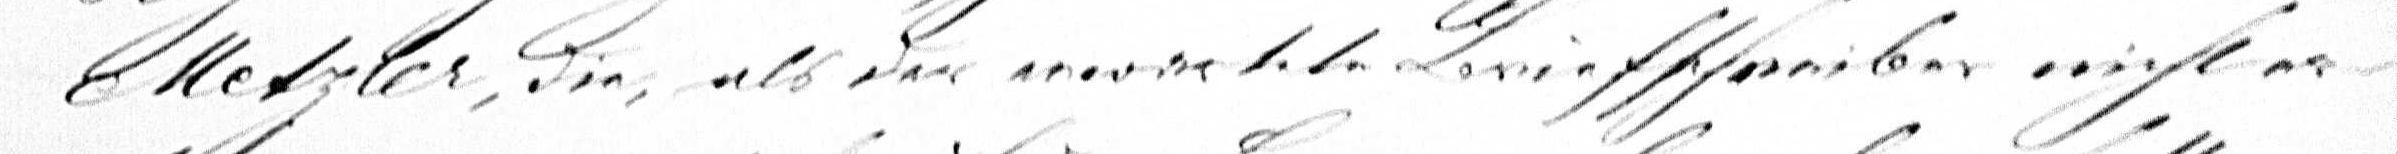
Metzler, die, als der erwartete Briefschreiber nicht er¬
